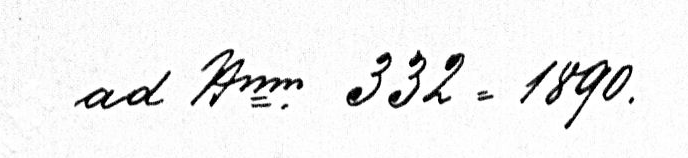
ad xx 332 - 1890.
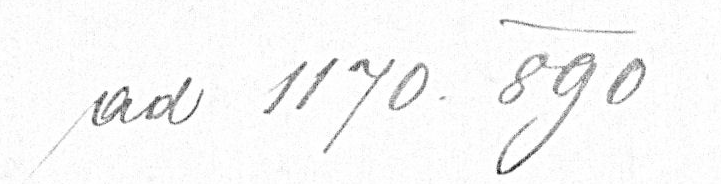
ad 1170.890
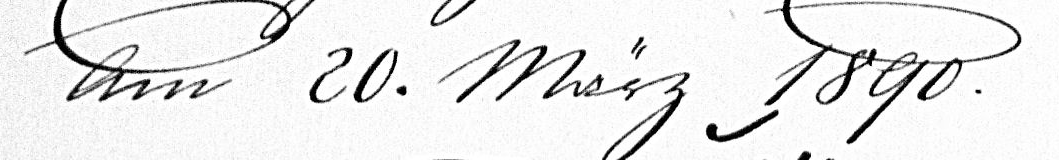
Am 20. März 1890
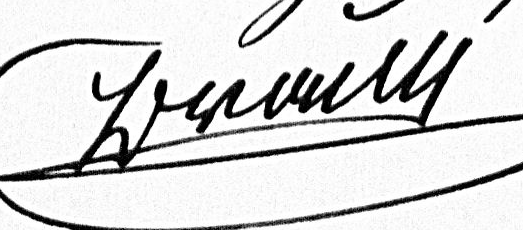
Braun
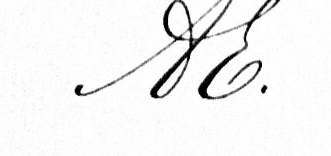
AE.
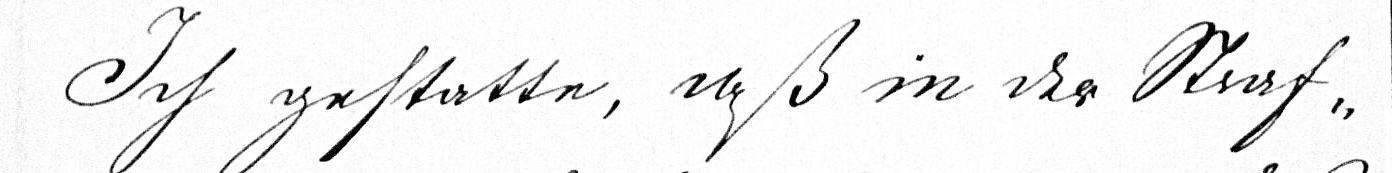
Ich gestatte, daß in der Straf¬
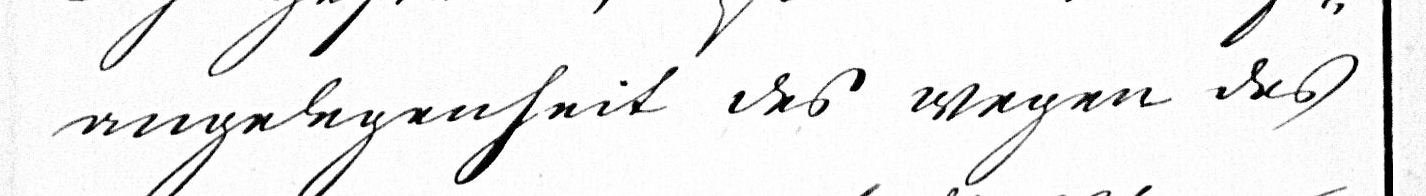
angelegenheit des wegen des
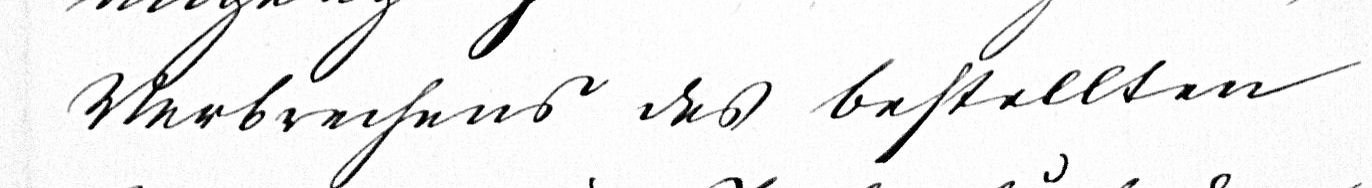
Verbrechens des bestellten
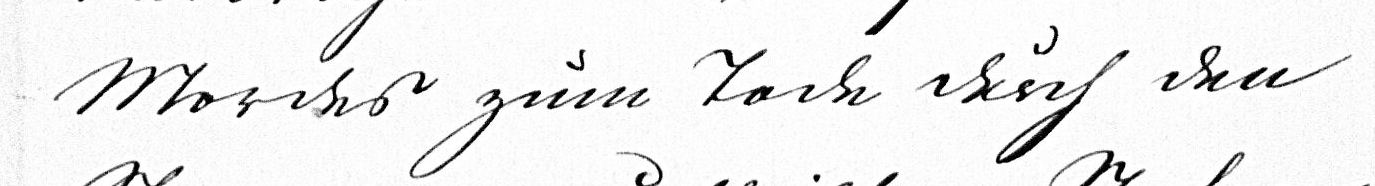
Mordes zum Tode durch den
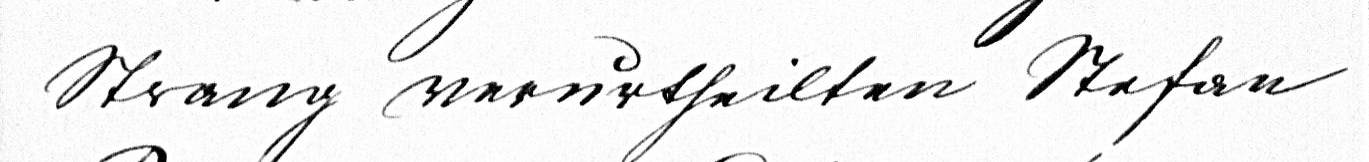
Strang verurtheilten Stefan
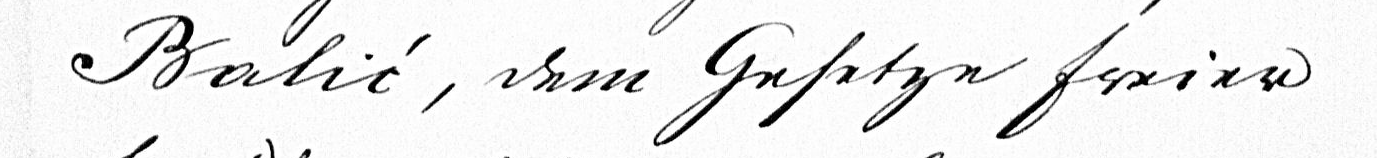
Balić, dem Gesetze freier
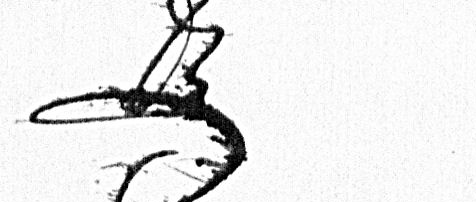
xx
